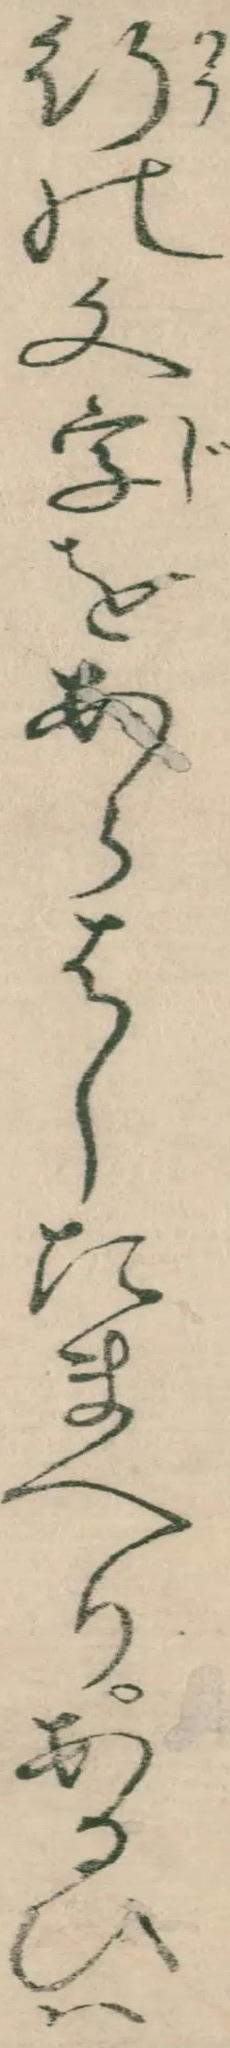行の文字をあらはしたまへり。あるひは
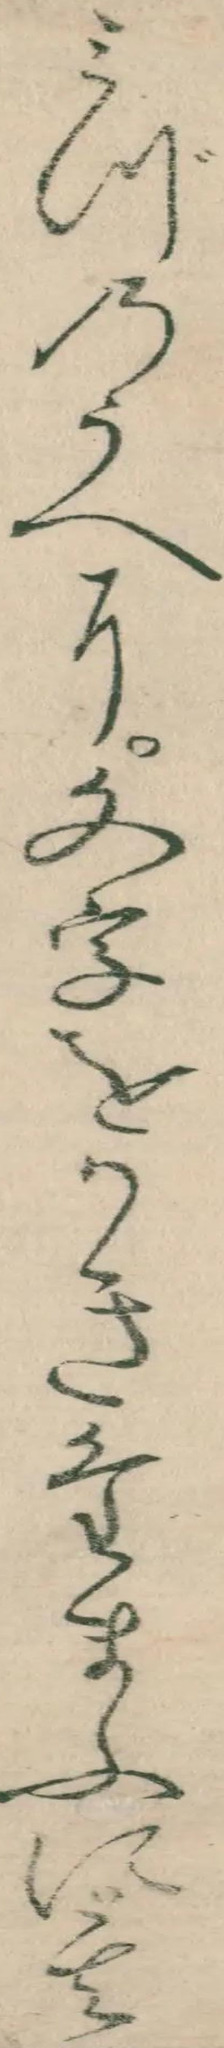みづのうへに。文字をかきたまふに。其
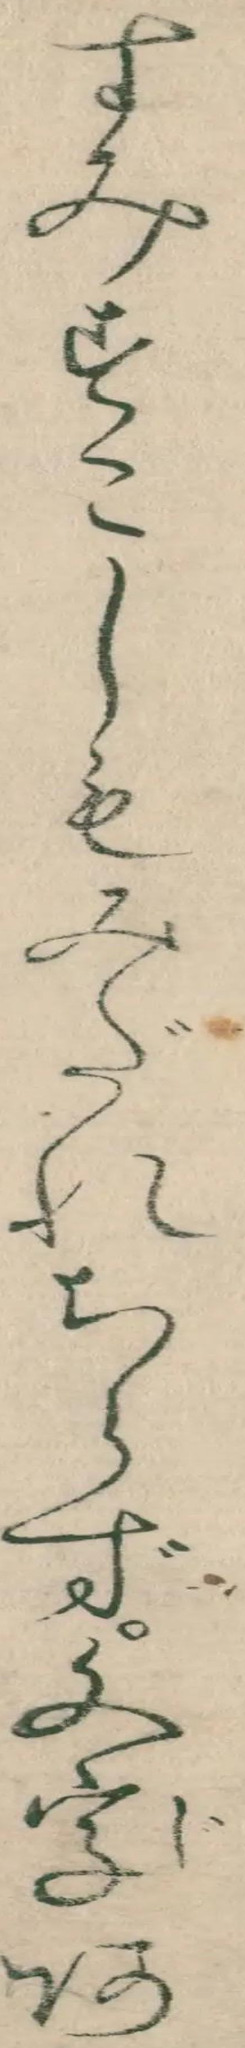すみすこしもみだれちらず。文字あ
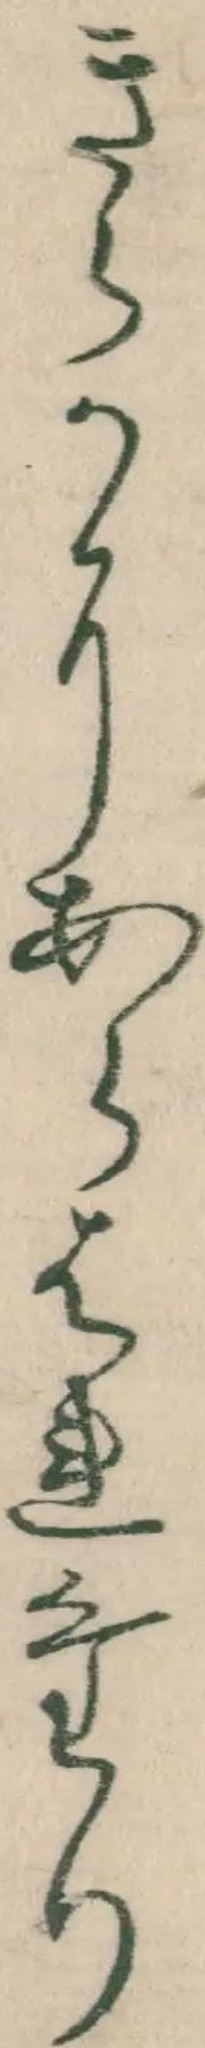きらかにあらはれたり

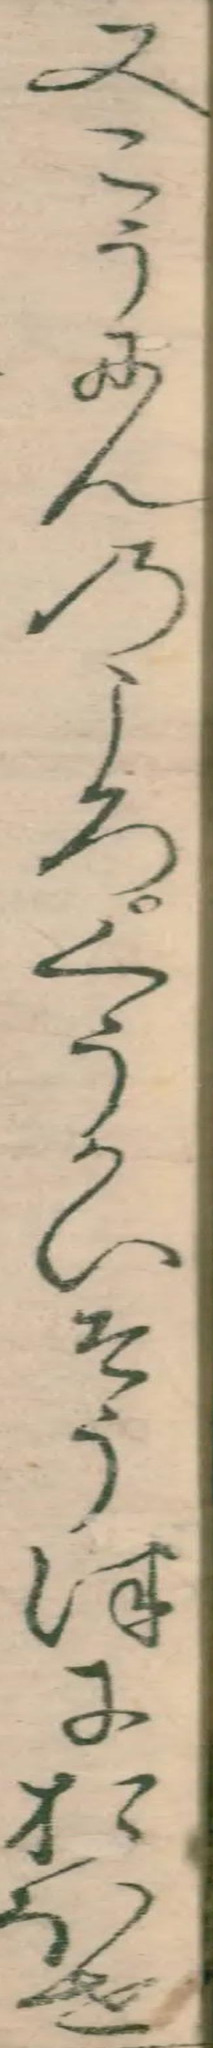又こうにんのころ。くうかいそうつにおほせ
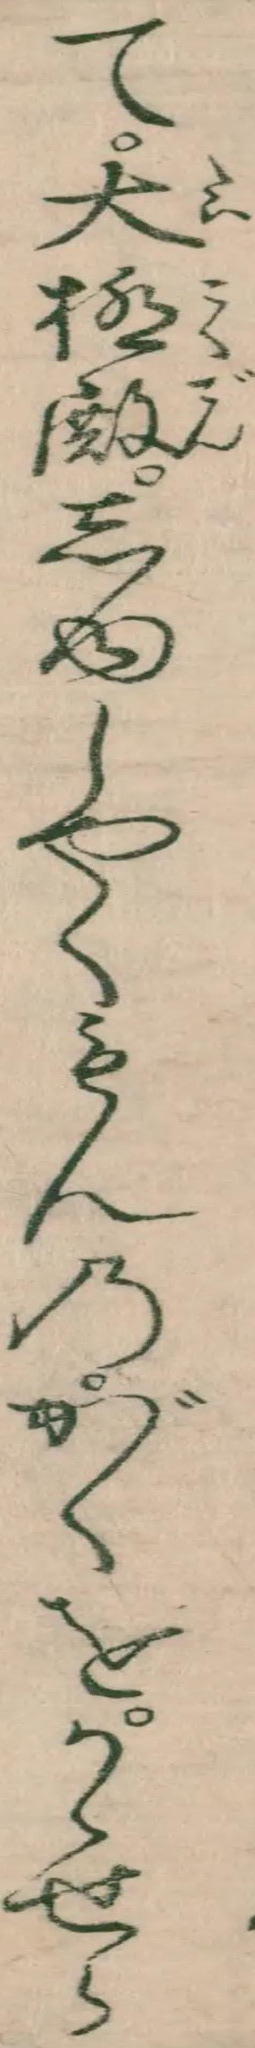て。大極殿。しゆしやくもんの。がくをかゝせら
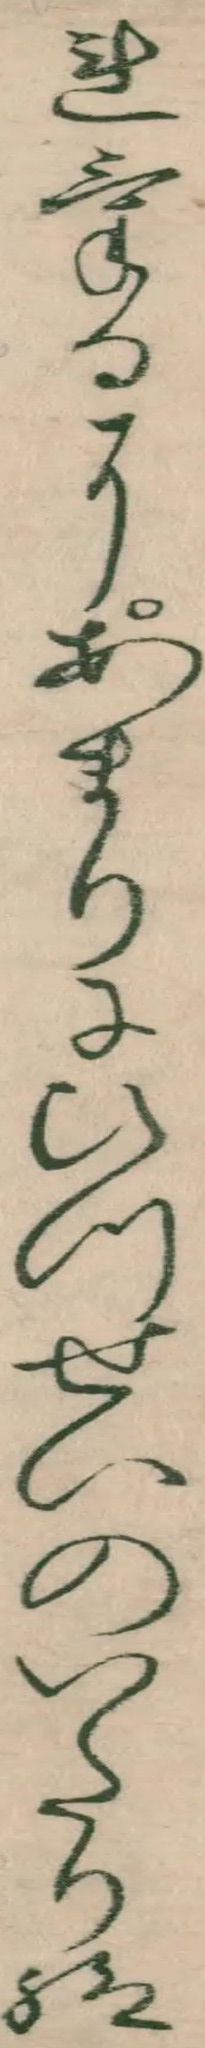れけるに。あまりにひつせいのいたり給
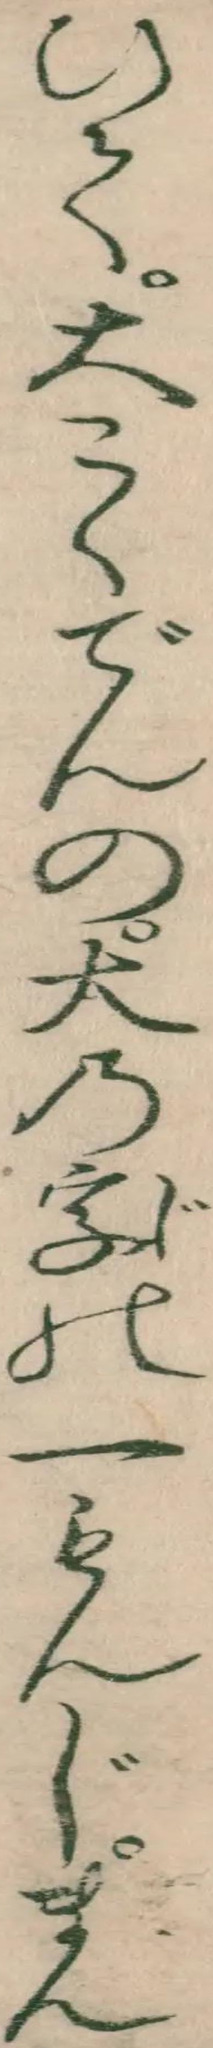ひて。大こくでんの。大の字の一もんじ。まん
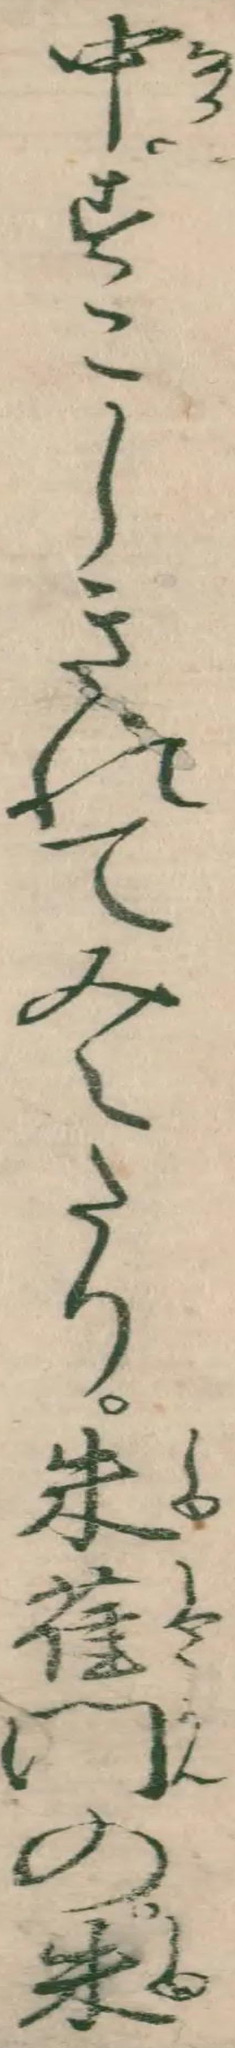中。すこしきれてみえたり。朱雀門の朱
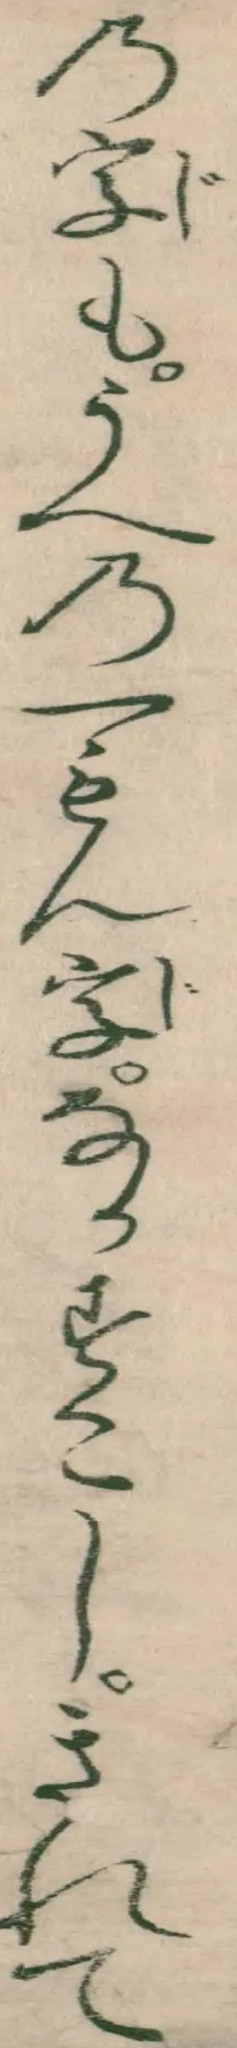の字も。うへの一もん字。なかすこし。きれて
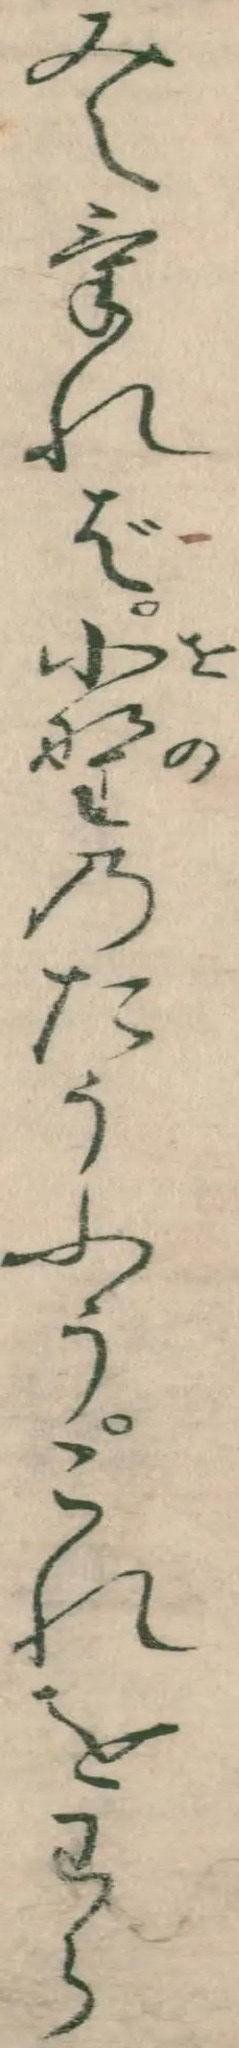みえければ。小野のたうふう。これをわら
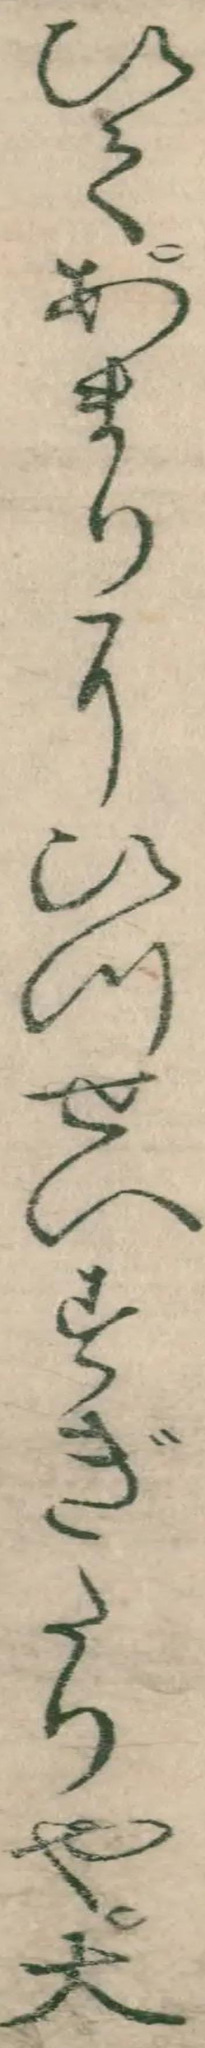ひて。あまりにひつせいすぎたりや。大
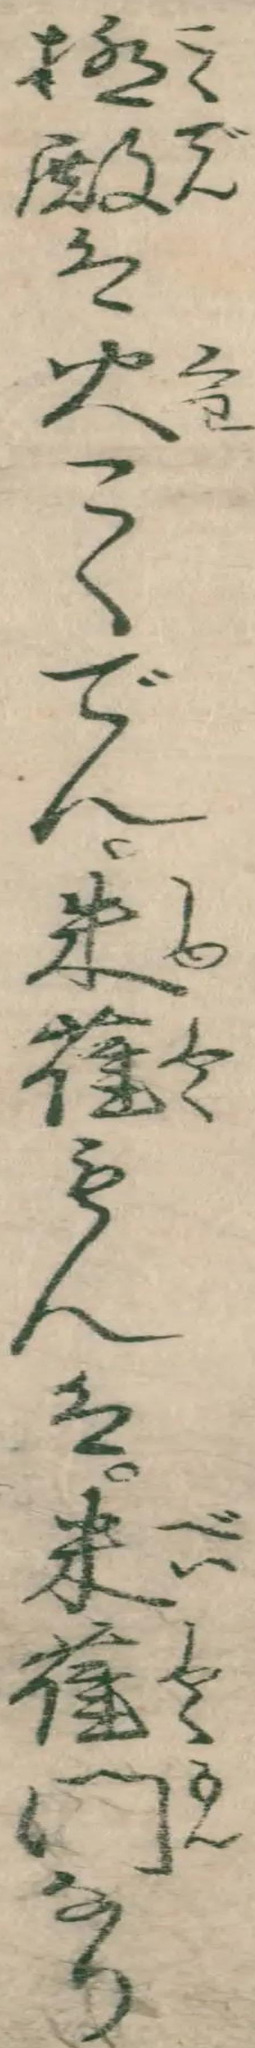極殿は火こくでん。朱雀もんは、米雀門なり
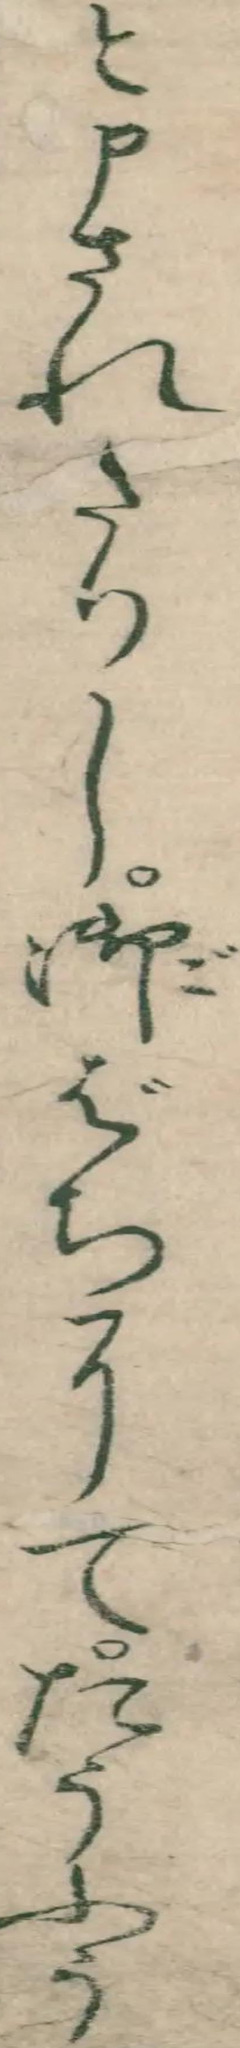と申されたりし。御ばちにて。たうふう

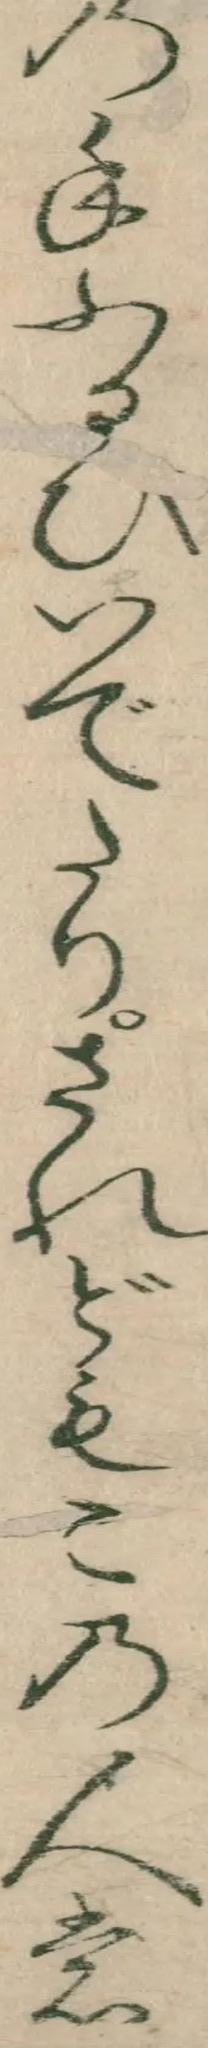の手ふるひいでたり。されどもこの人も
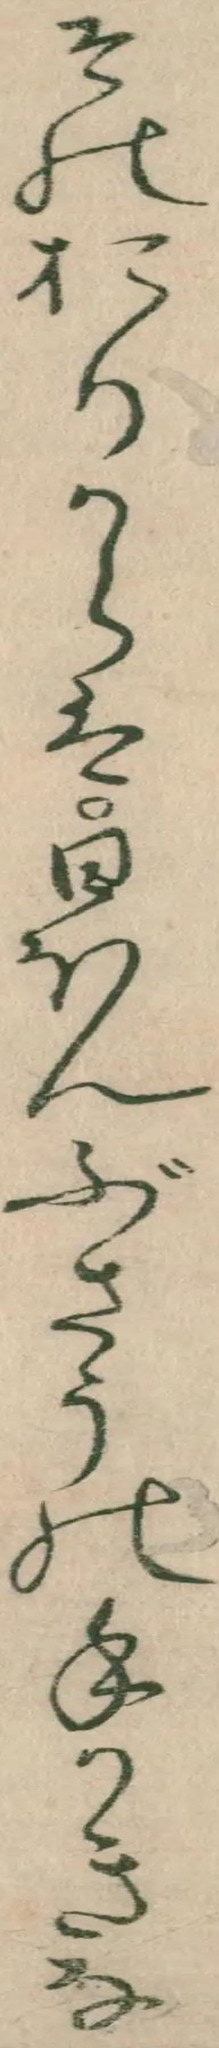そのおりからは。日ほんぶさうの手かきな
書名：弘法大師御本地 3巻. [2]
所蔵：国立国会図書館 National Diet Library, JAPAN
